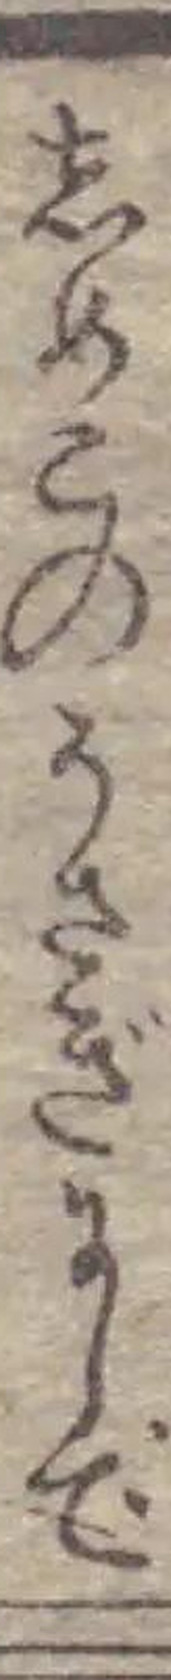しめこのうさぎにして
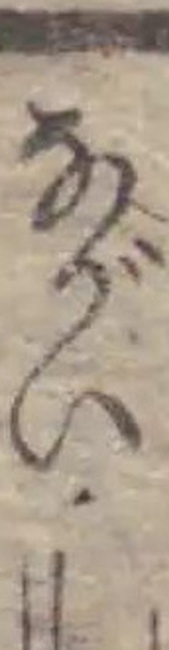ながい
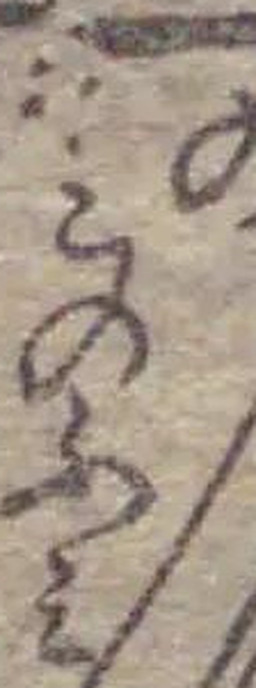このふみ
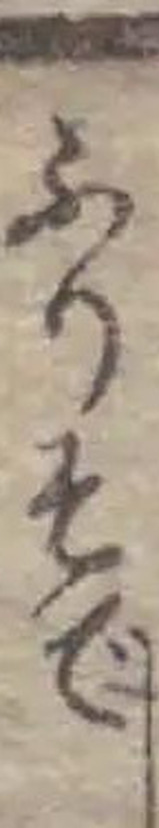ふりそで
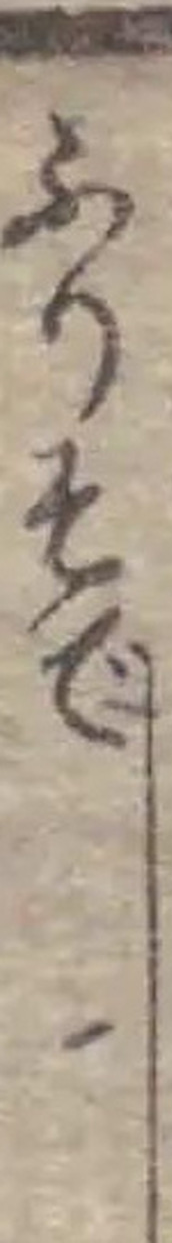ふりそで
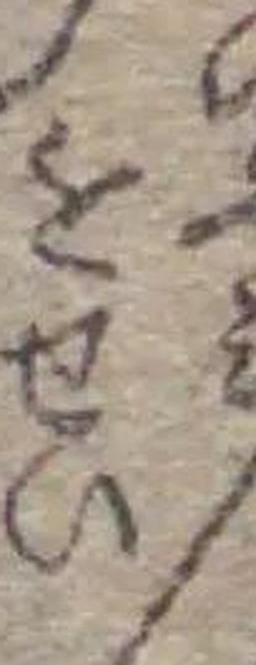をせい
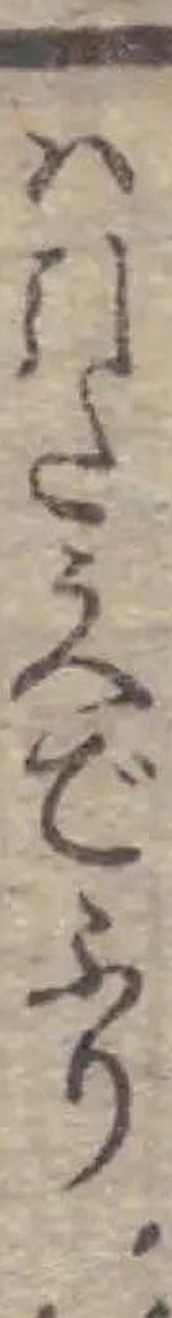は引たうへでふり
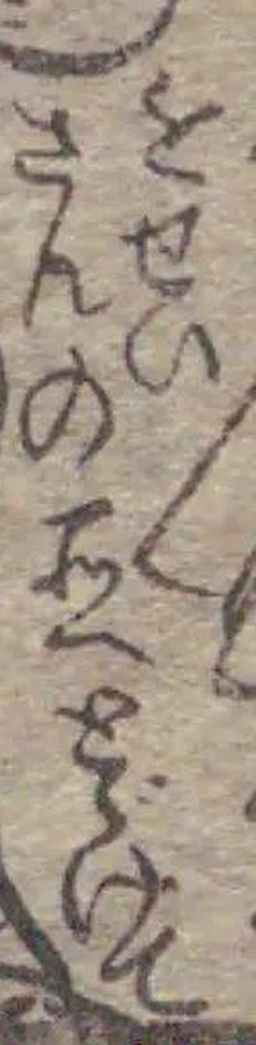さんの所へとゞけて
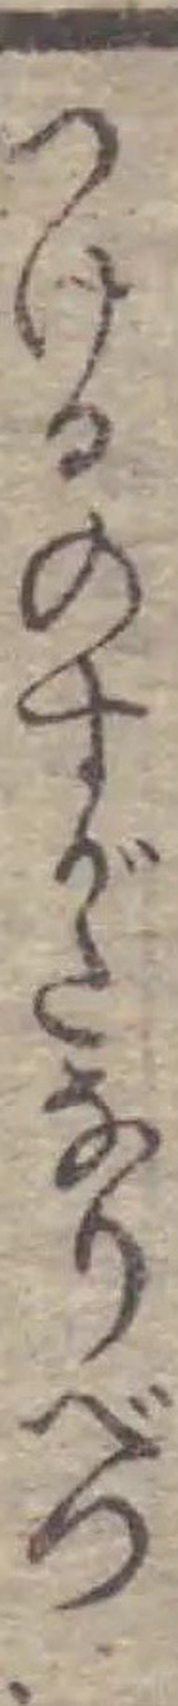つけるのすがたなりべつ
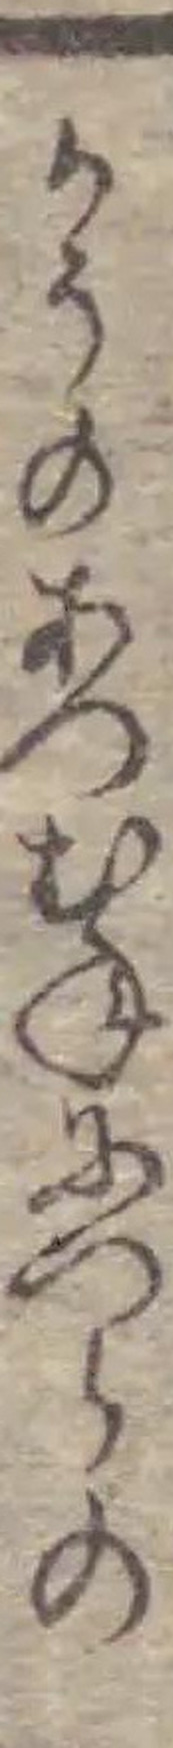かうのあつむねにつらの
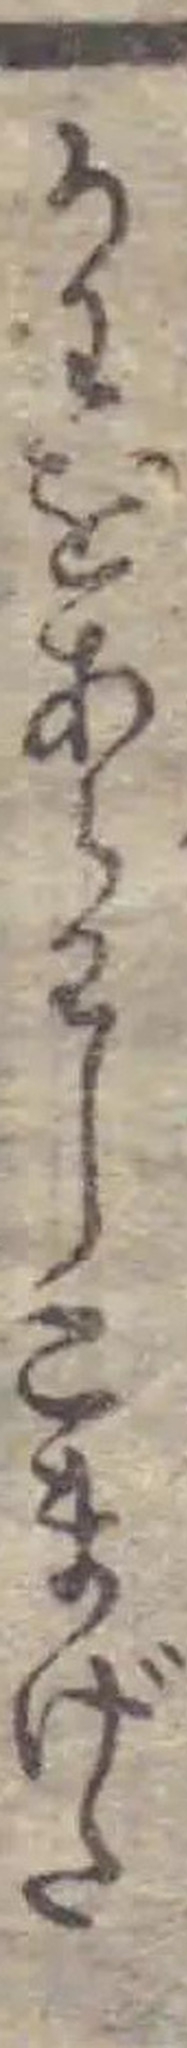かわをあらわしこまげた
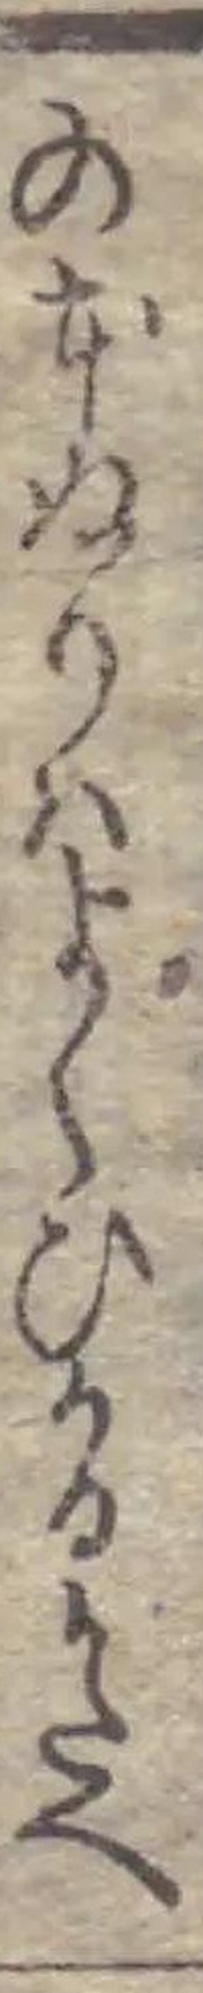の本ぬりはよくひかるかたへ
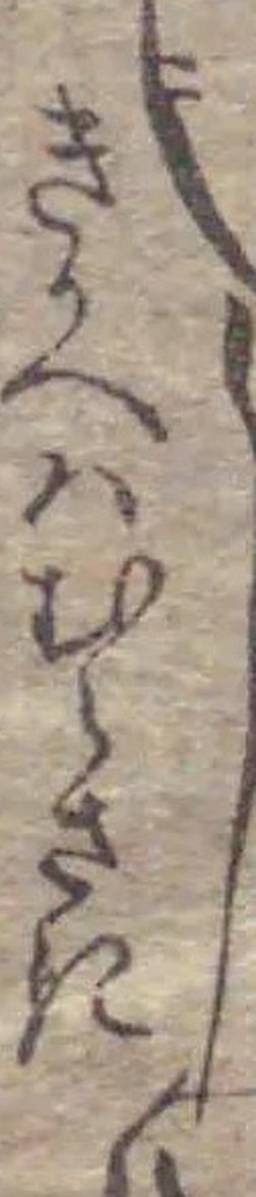きかへはむらさき
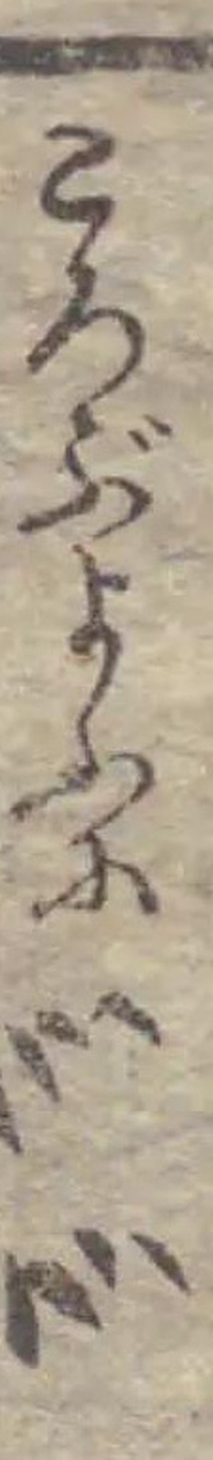ころぶよふに
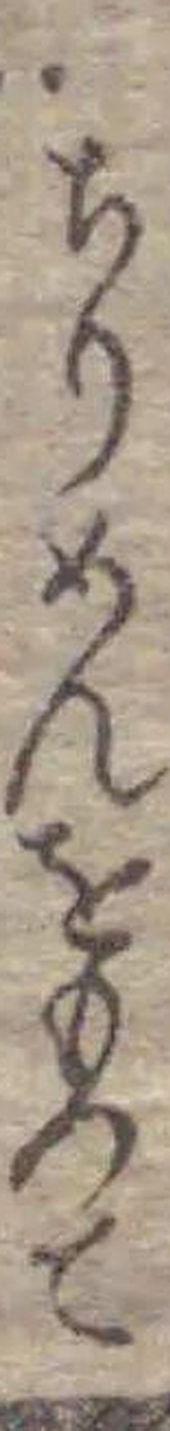ちりめんをもつて
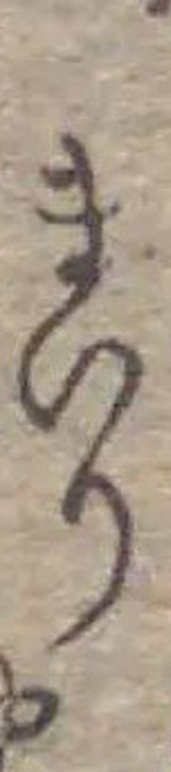まいり
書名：かんなんの夢枕 2巻
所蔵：国立国会図書館 National Diet Library, JAPAN
